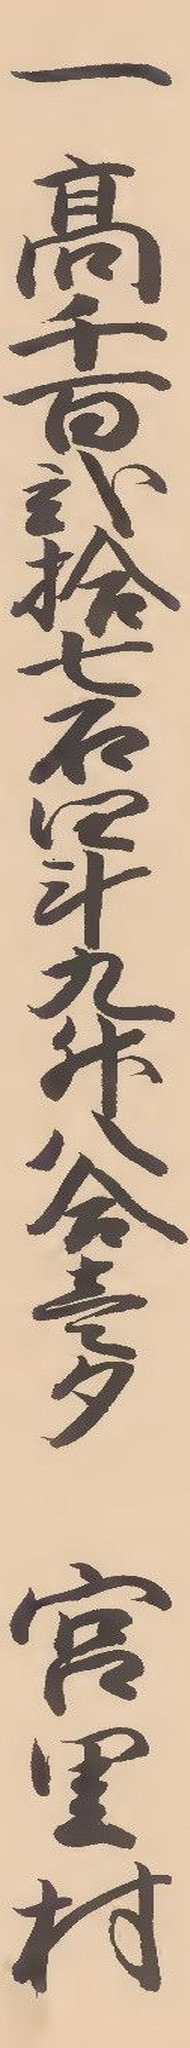一高千百弐拾七石四斗九升八合壱勺宮里村

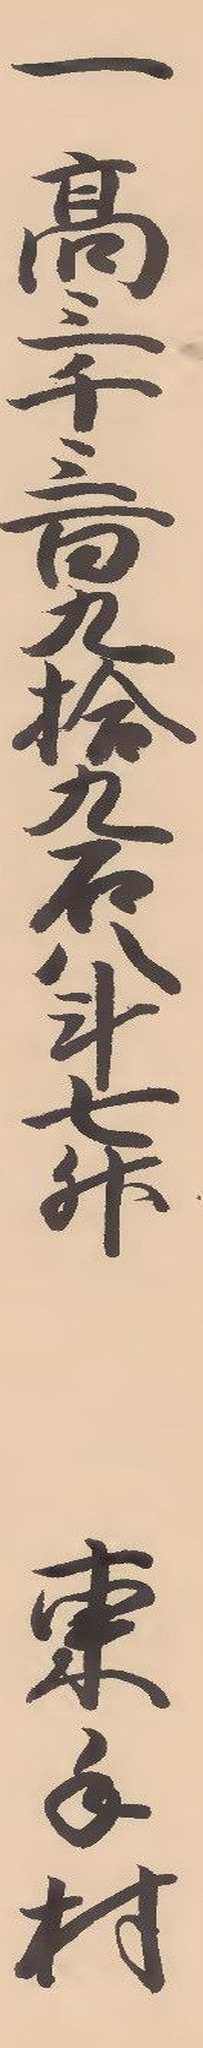一高三千三百九拾九石八斗七升東手村
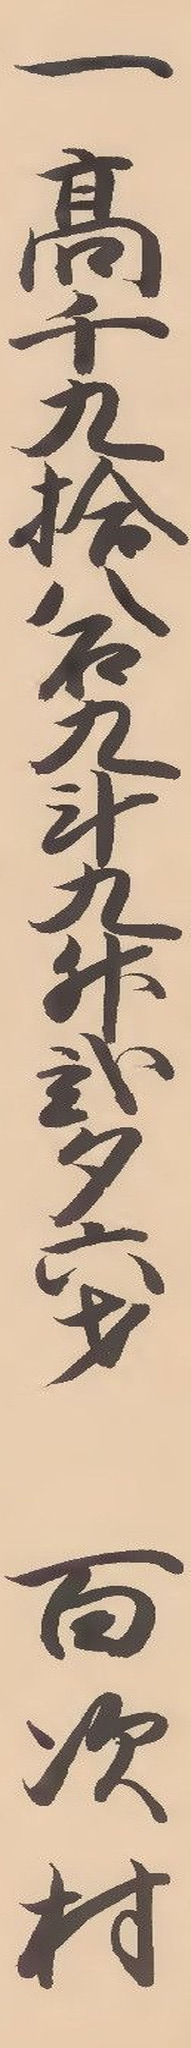一高千九拾八石九斗九升弐勺六才百次村
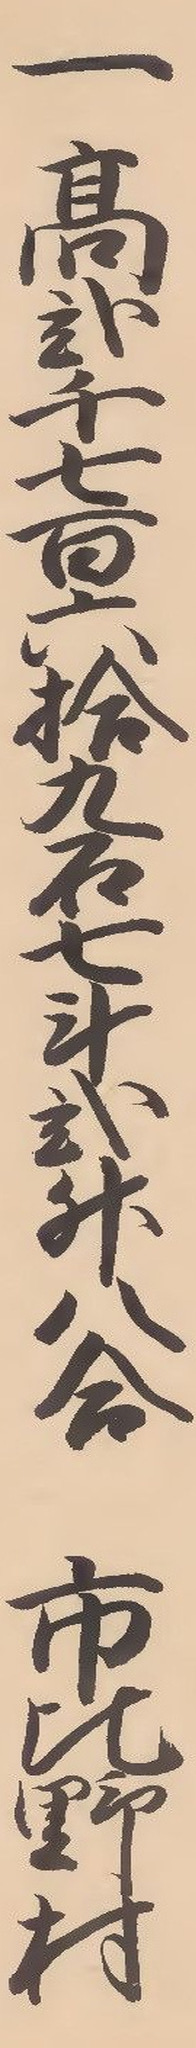一高弐千七百六拾九石七斗弐升八合市比野村
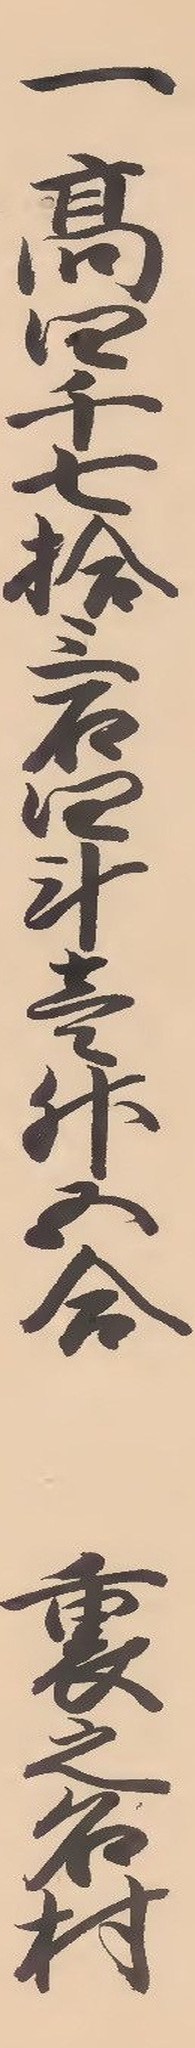一高四千七拾三石四斗壱升五合裏之名村
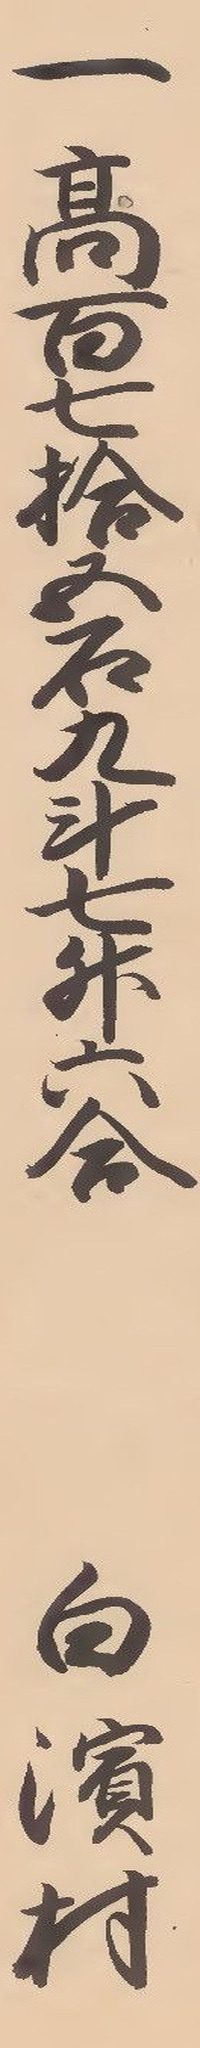一高百七拾五石九斗七升六合白浜村
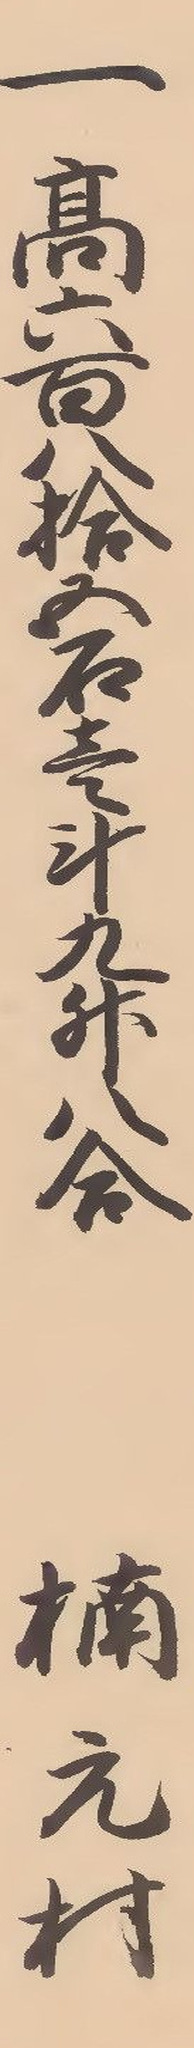一高六百八拾五石壱斗九升八合楠元村
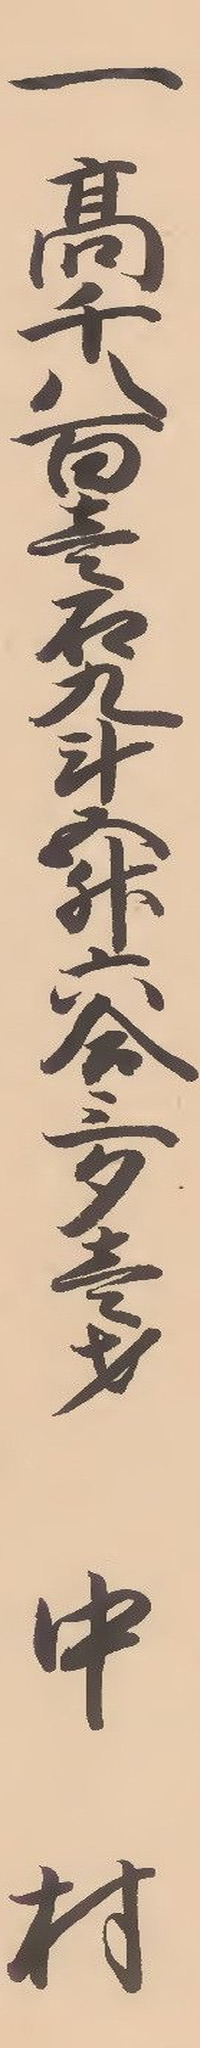一高千八百壱石九斗五升六合三勺壱才中村
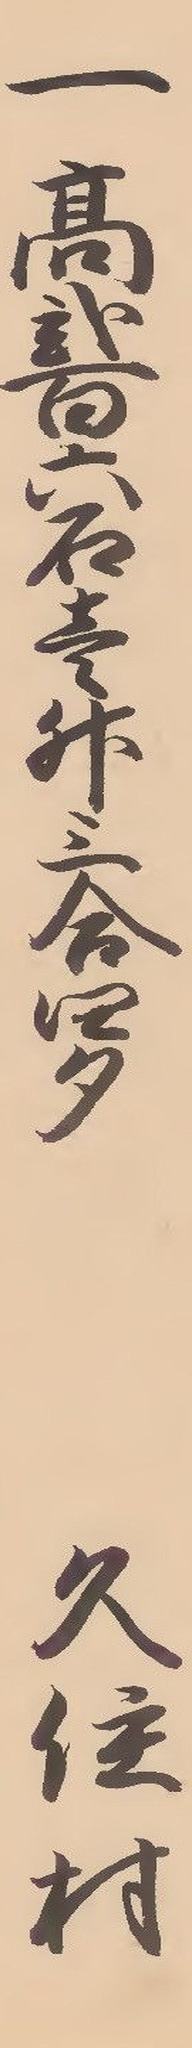一高弐百六石壱升三合四勺久住村

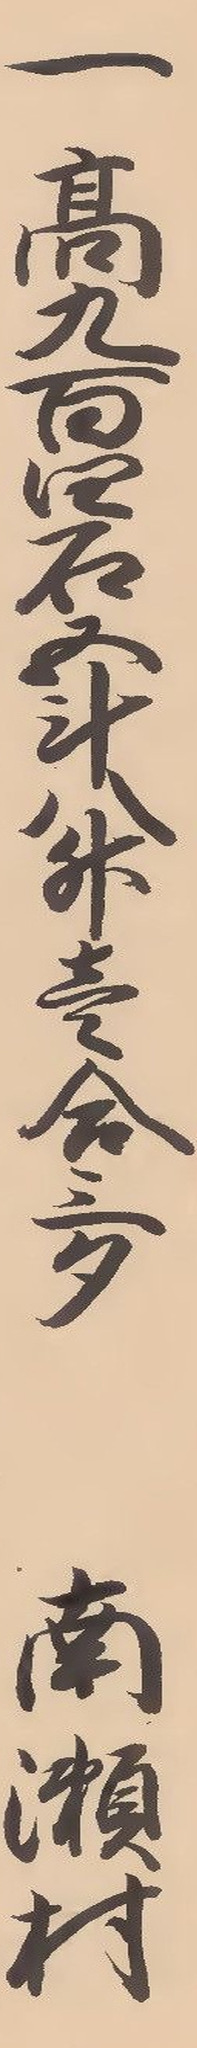一高九百四石五斗八升壱合三勺南瀬村
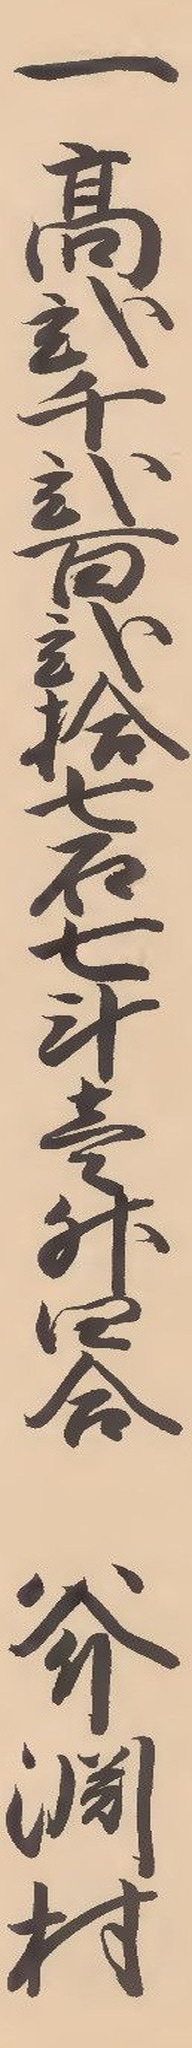一高弐千弐百弐拾七石七斗壱升四合谷渕村
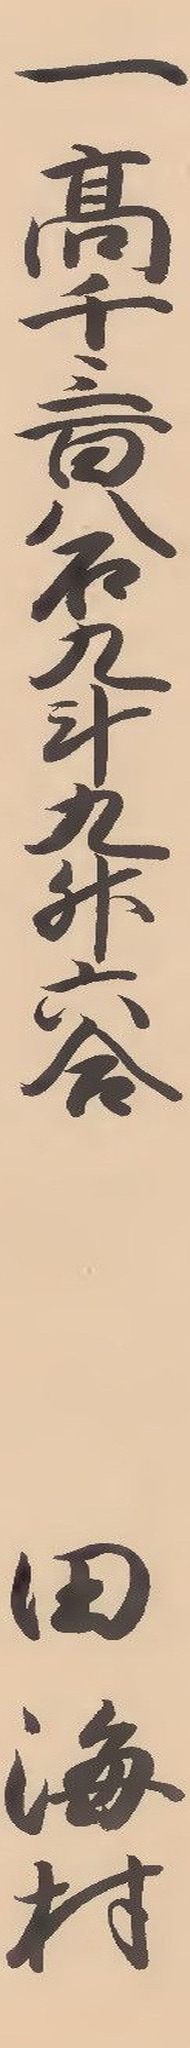一高千三百八石九斗九升六合田海村
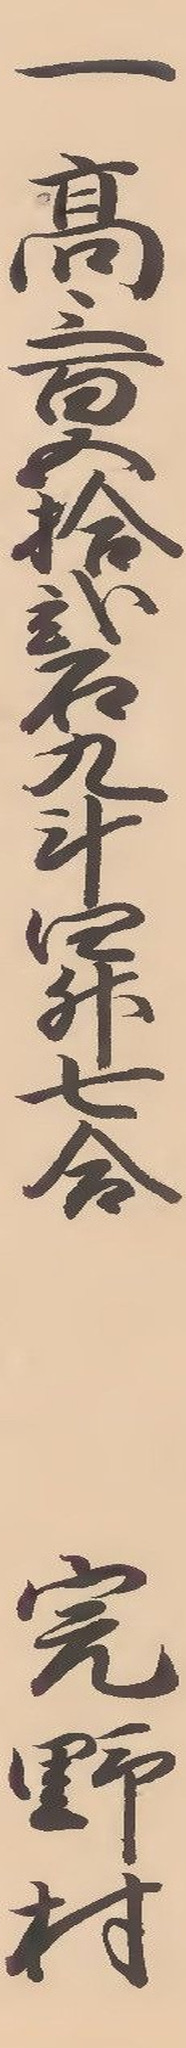一高三百五拾弐石九斗四升七合完野村
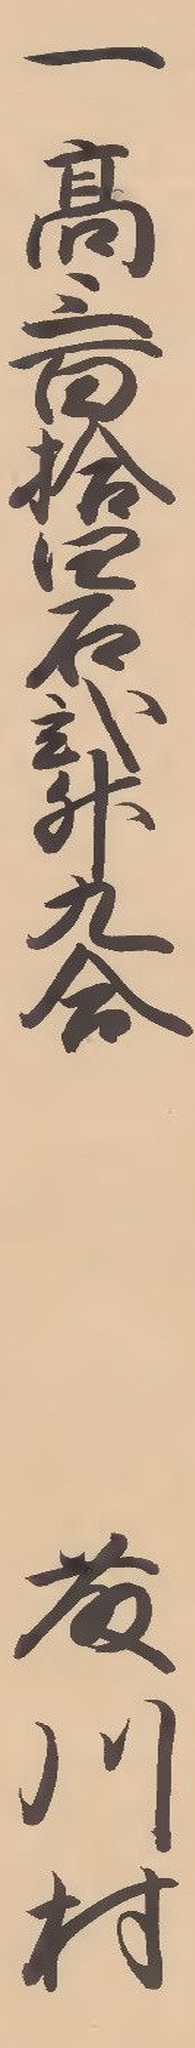一高三百拾四石弐升九合藤川村
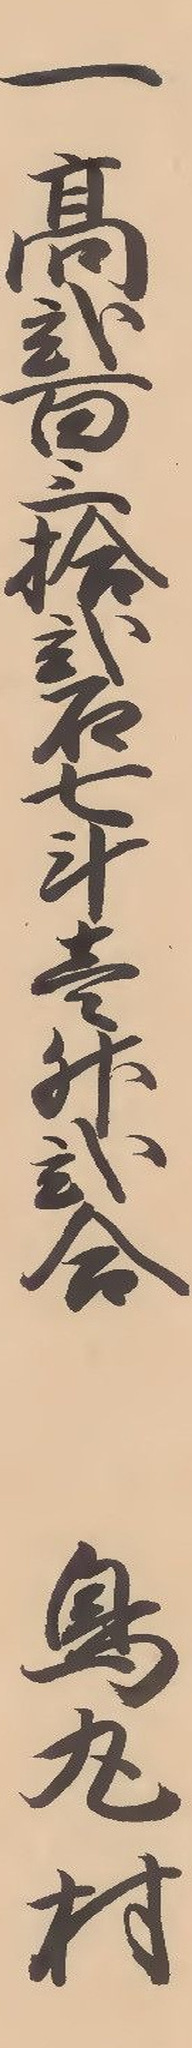一高弐百三拾弐石七斗壱升弐合鳥丸村
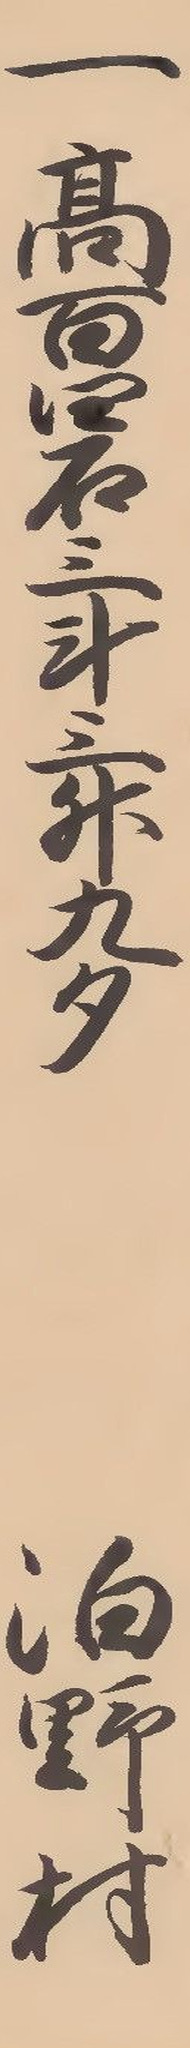一高百四石三斗三升九勺泊野村
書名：薩摩国郷帳
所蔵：国立公文書館 National Archives of Japan
